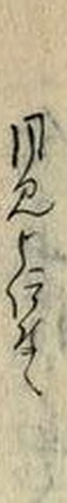目見被仰付候
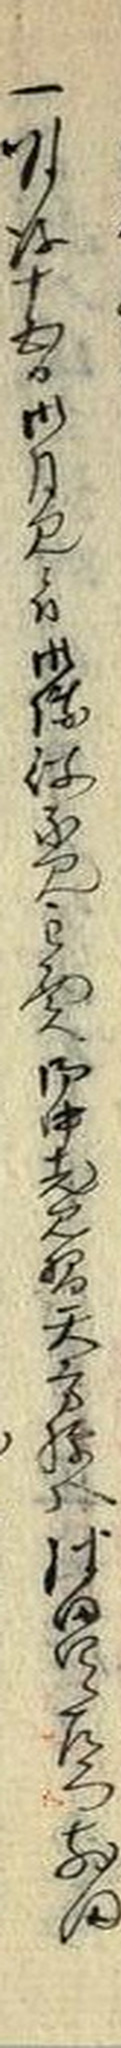一明後十五日御月見ニ付御傅役永見主殿御中老見習天方孫八津田四郎左衛門前田
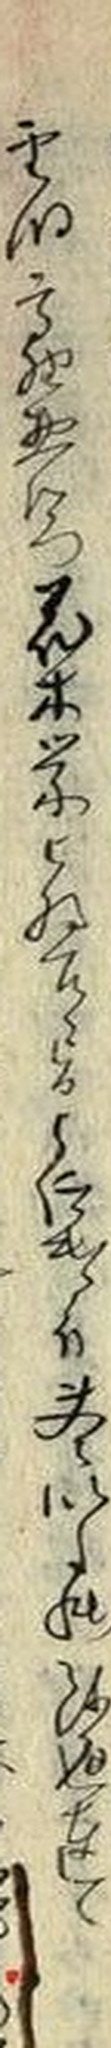雲洞高野惣左衛門花木栄被為召候旨被仰出候ニ付夫々以手紙致通達候
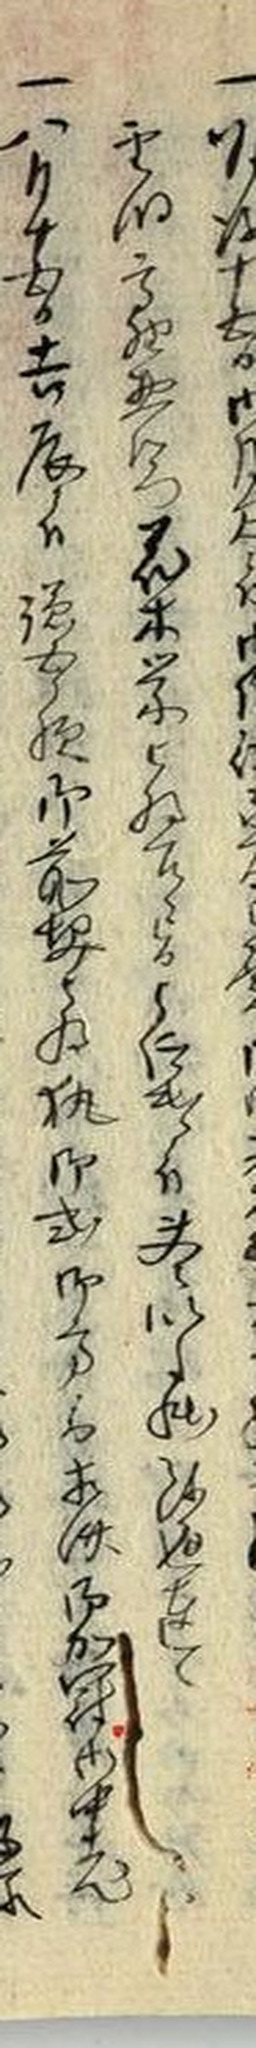一八月十五日吉辰ニ付謙五郎様御前髪被為執御式御方ニ而相済御加冠御中老
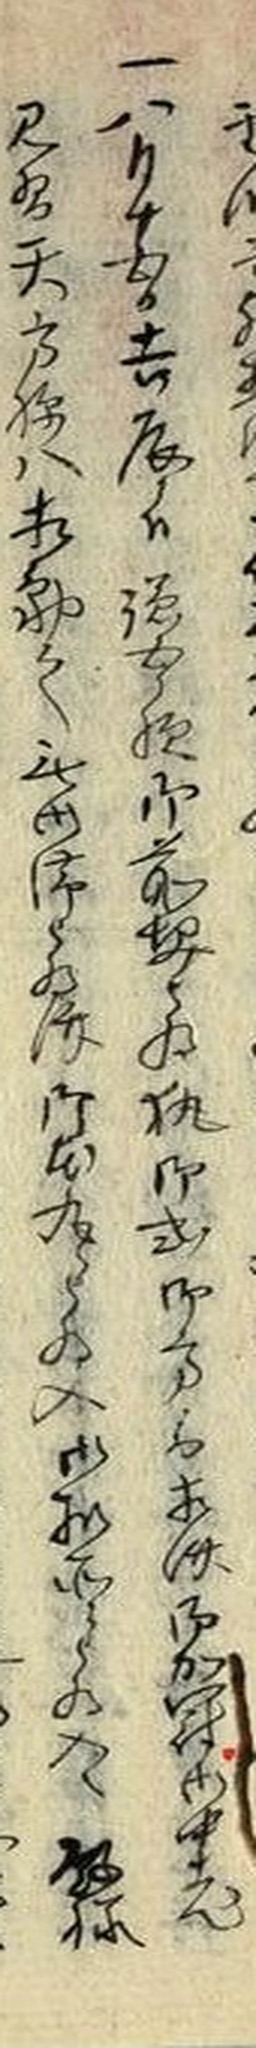見習天方孫八相勤之無御滞被為済御本丸へ被為入御控所ニ被為入候殿様
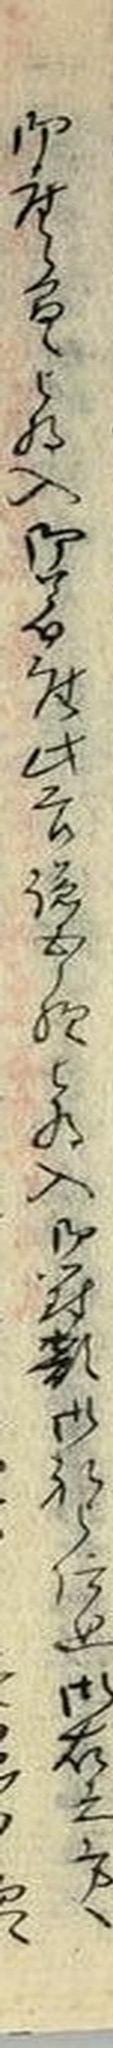御座之間へ被為入御着座此節謙五郎様被為入御対顔御礼被仰上御右之方へ
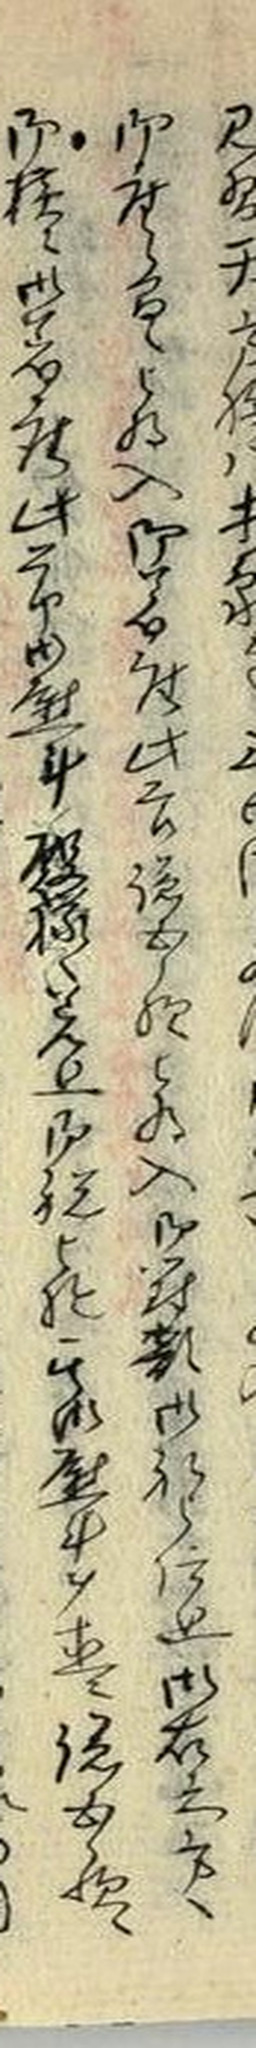御横ニ御着座此節御熨斗殿様へ差上御祝被遊其御熨斗ヲ直ニ謙五郎様へ
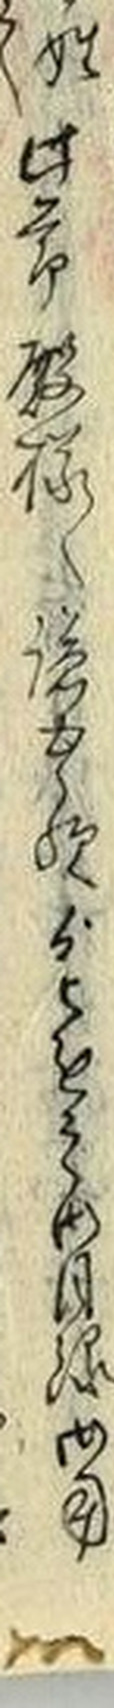役之此節殿様へ謙五郎様ゟ被進之御目録御用
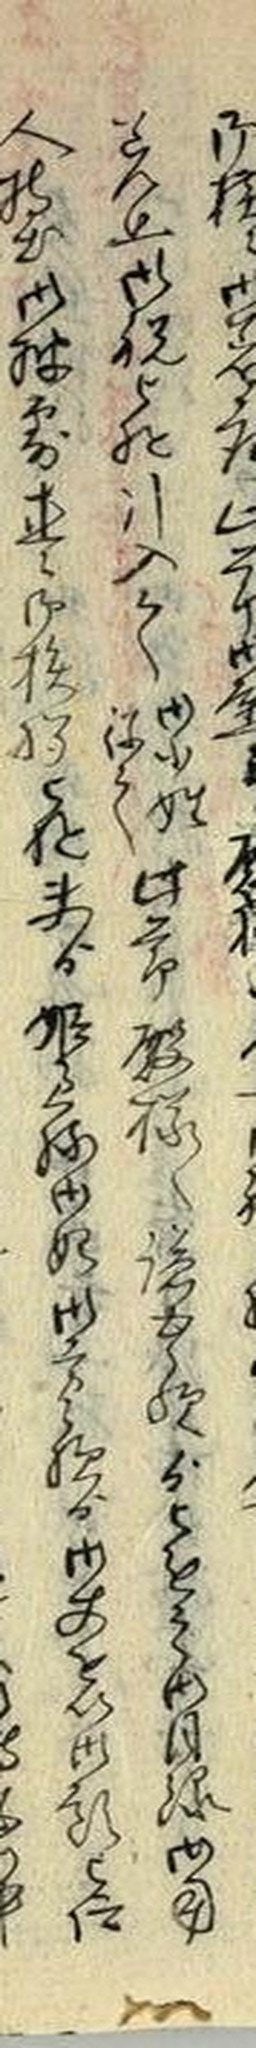人持出御披露直ニ御挨拶被遊夫ゟ姫君様御始御方々様ゟ御使を以御歓被仰
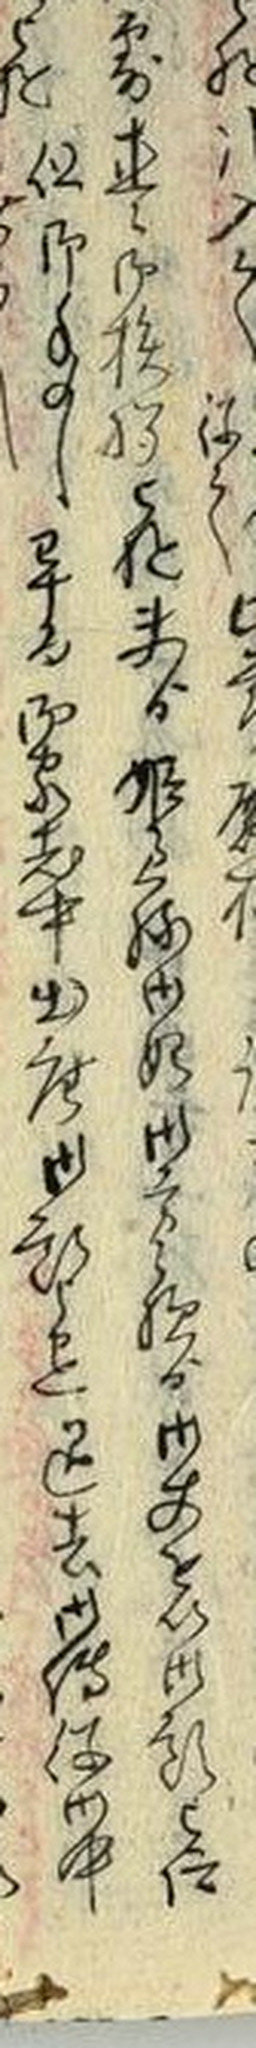無之畢而御家老中出座御歓被申上退去御傅役御中
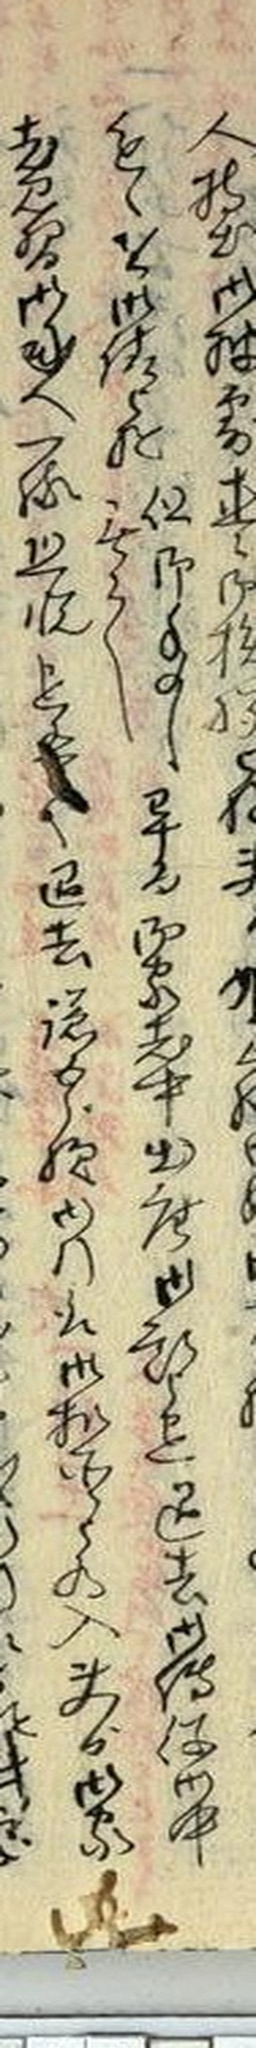老見習御用人一統恐悦申上有之退去謙五郎様御引取御控所へ被為入夫ゟ御家
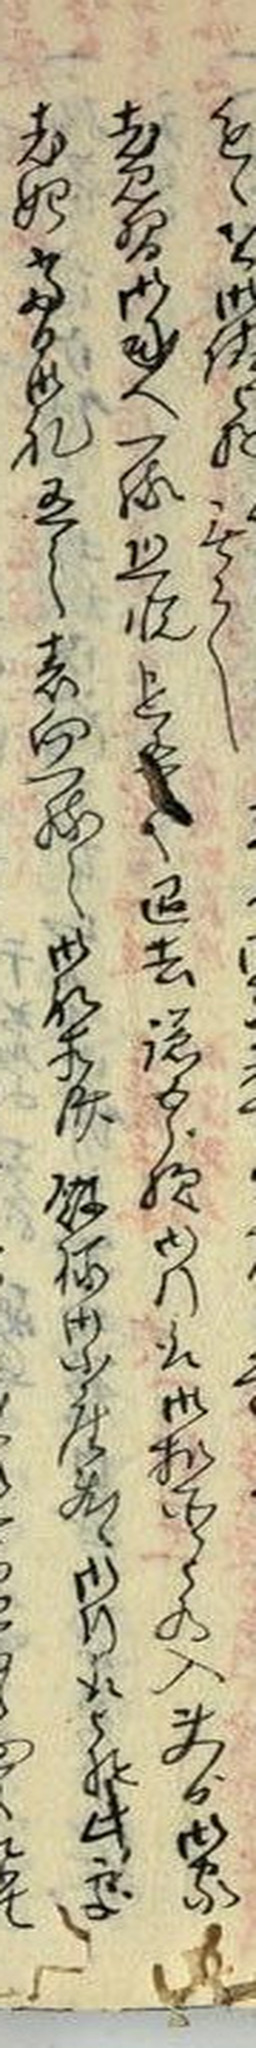老始当日御礼有之表向一統之御礼相済殿様御小座敷へ御引取被遊此処
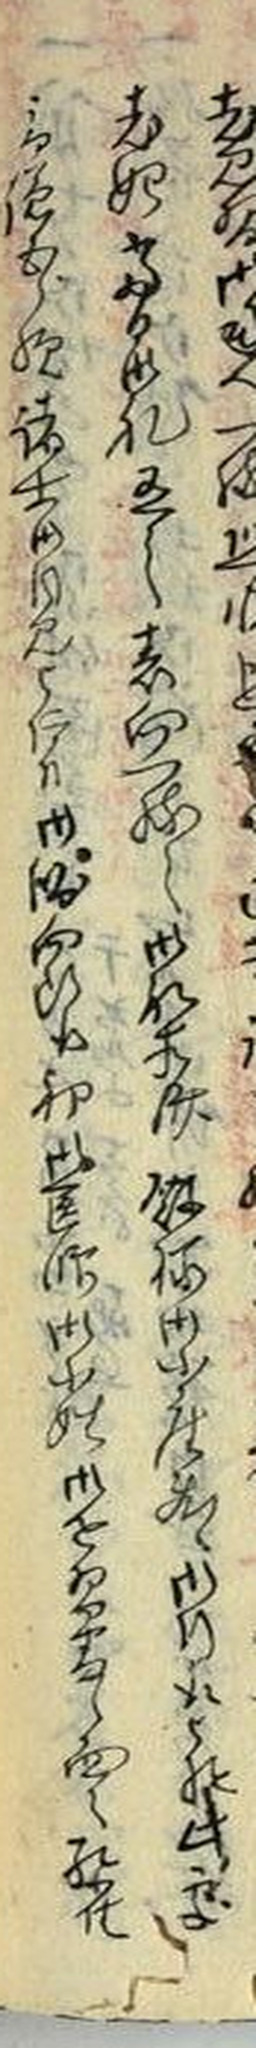ニ而謙五郎様諸士御目見被仰付御側向頭取初御医師御小姓御近習番之面々孔雀
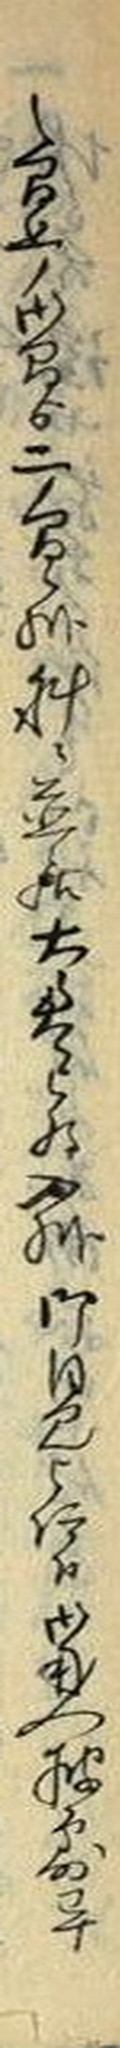之間上ノ御間ゟ二ノ間へ掛斜ニ並居大奥被為入掛御目見被仰付御用人披露畢
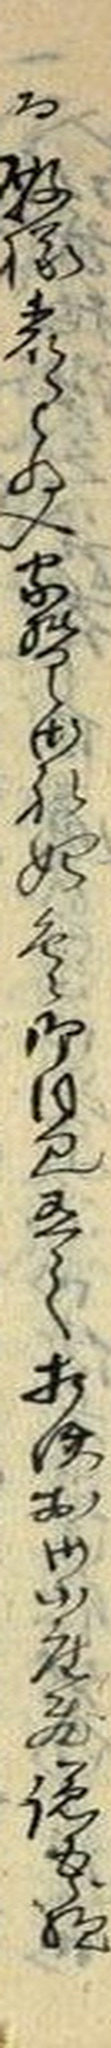而殿様表へ被為入家督之御礼始色々御目見有之相済於御小座敷謙五郎様
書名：少傅日録抄（斉承付側向頭取日記、在国）
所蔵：福井県文書館 Fukui Prefectural Archives
